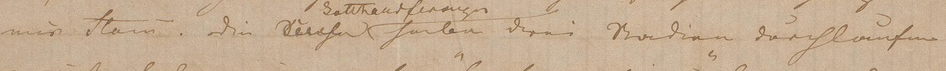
mir Stamm – die SacheGotthardfrage habe drei Stadien durchlaufen
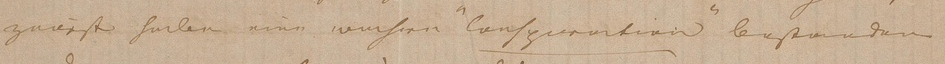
zuerst habe eine wahre «Conspiration» bestanden
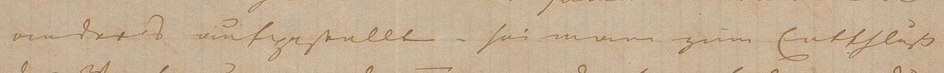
anders aufgestellt – sei man zum Entschluß
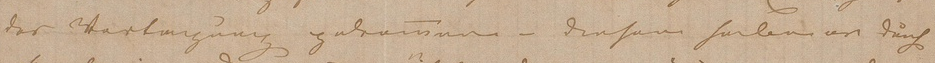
der Vertagung gekommen – diesen habe er durch
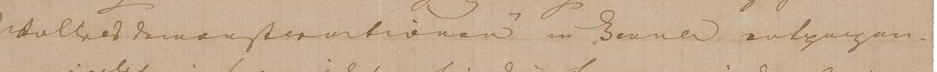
«VolksDemonstrationen» in Genua entgegen-
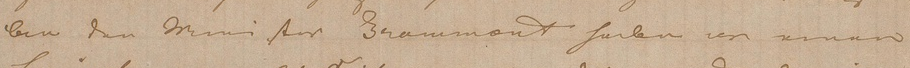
An den Minister Grammont habe er einen
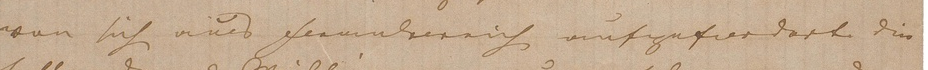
von sich aus Frankreich aufgefordert die
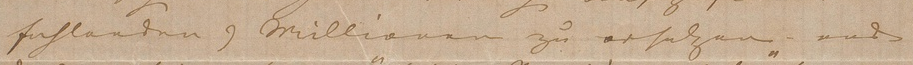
fehlenden 9 Millionen zu ersetzen – und
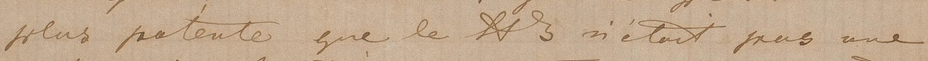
plus potente que le St G n'était pas une
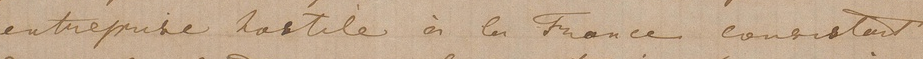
entreprise hostile à la France consistant
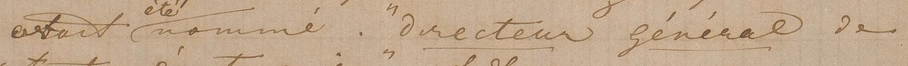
a etaitété nommé «Directeurgénéral de
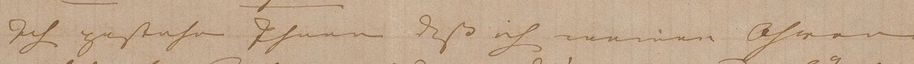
Ich gestehe Ihnen daß ich meinen Ohren
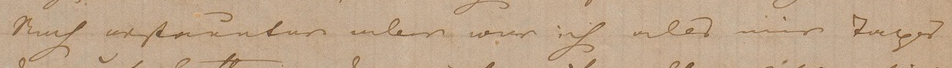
Noch erstaunter aber war ich als mir Tags
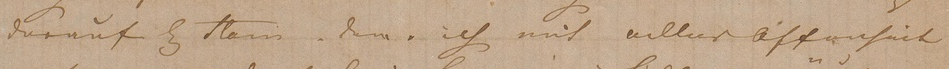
darauf Herr Stamm – dem ich mit aller Offenheit
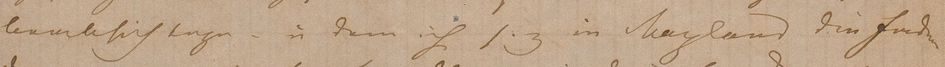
beabsichtige – u dem ich s. z in Mayland die Fäden
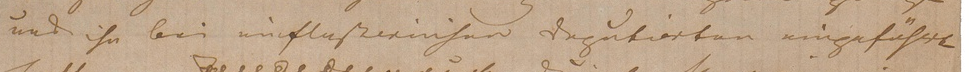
und ihn bei einflußreichen Deputirten eingeführt
